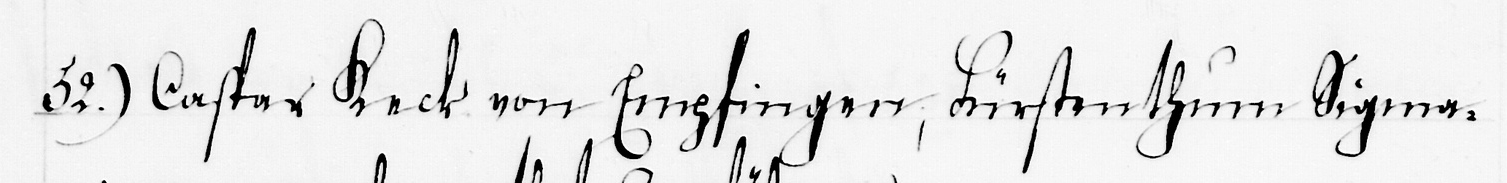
52.) Caspar Keck von Empfingen, Fürstenthum Sigma¬
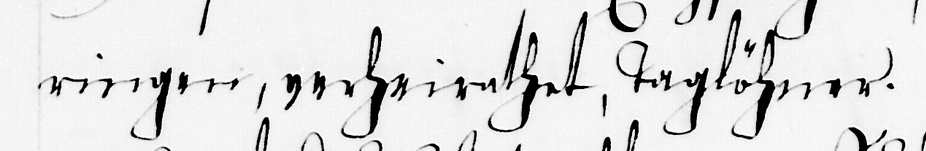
ringen, verheirathet, Taglöhner.
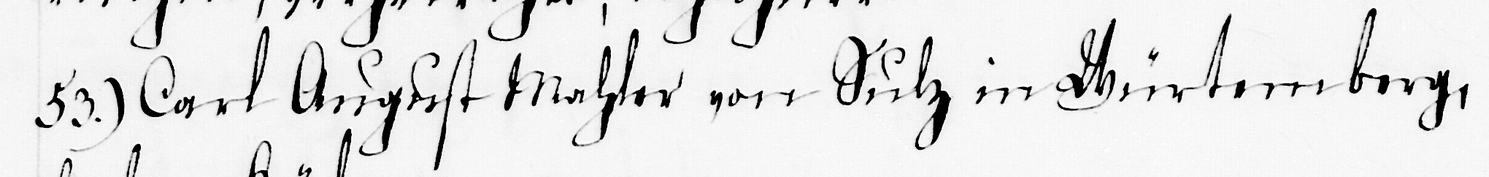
53.) Carl August Mahler von Sulz in Würtemberg,
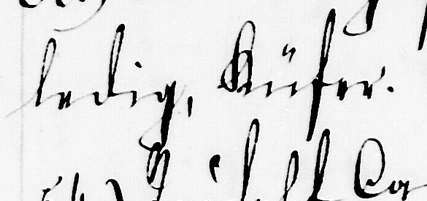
ledig, Küfer.
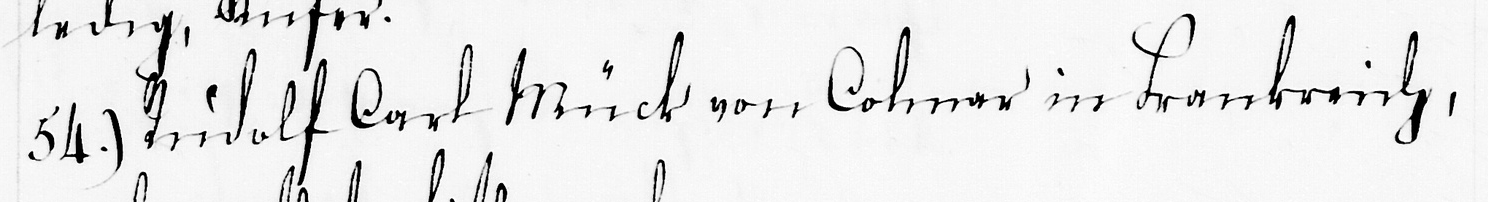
54.) Rudolf Carl Mück von Colmar in Frankreich,
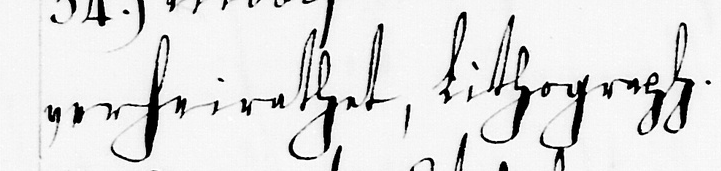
verheirathet, Lithograph.
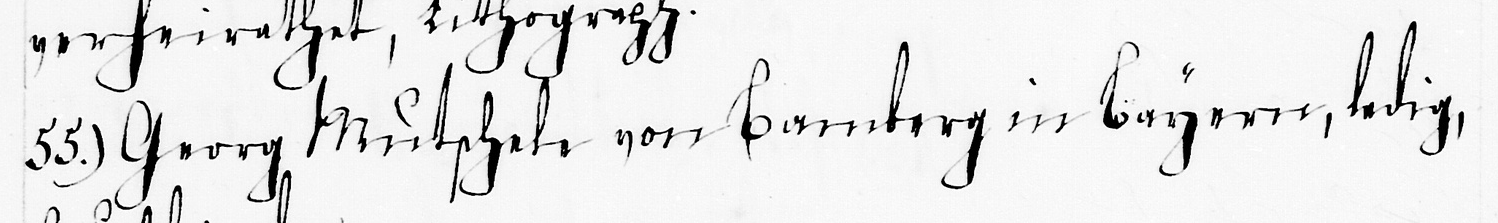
55.) Georg Mutschele von Bamberg in Bayern, ledig,
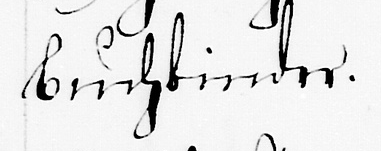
Buchbinder.
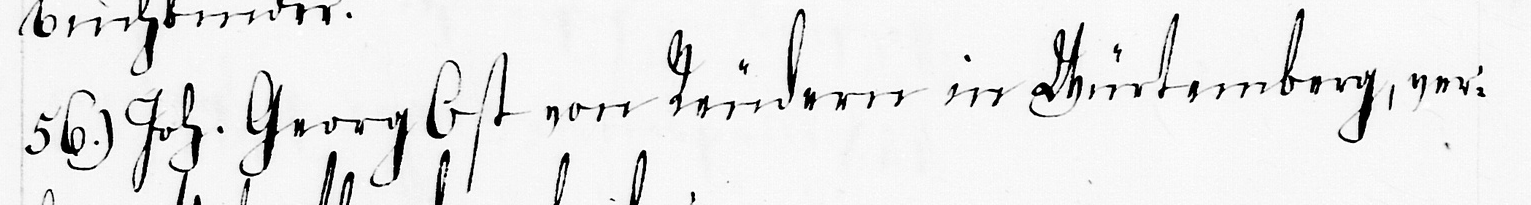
56.) Joh. Georg Ost von Reudern in Würtemberg, ver¬
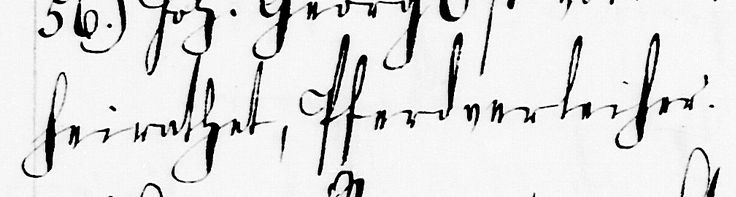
heirathet, Pferdverleiher.
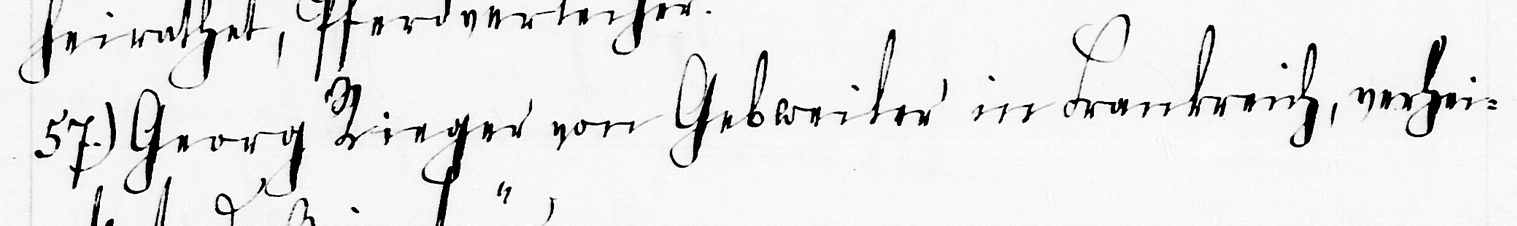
57.) Georg Rieger von Gebweiler in Frankreich, verhei¬
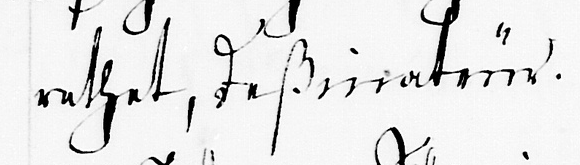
rathet, Deßinateur.
